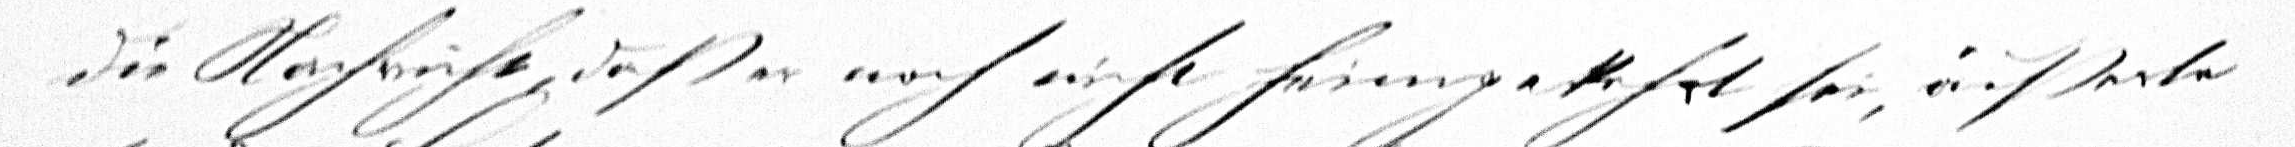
die Nachricht, daß er noch nicht heimgekehrt sei, äußerte
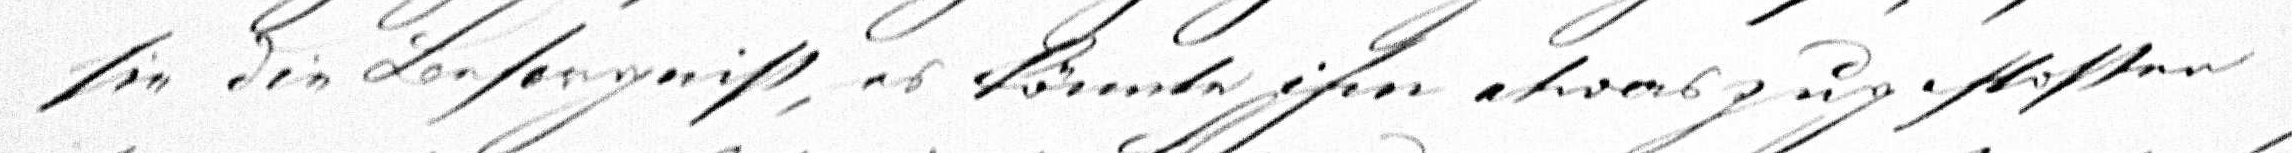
sie die Besorgniß, es könnte hm etwas zugestoßen
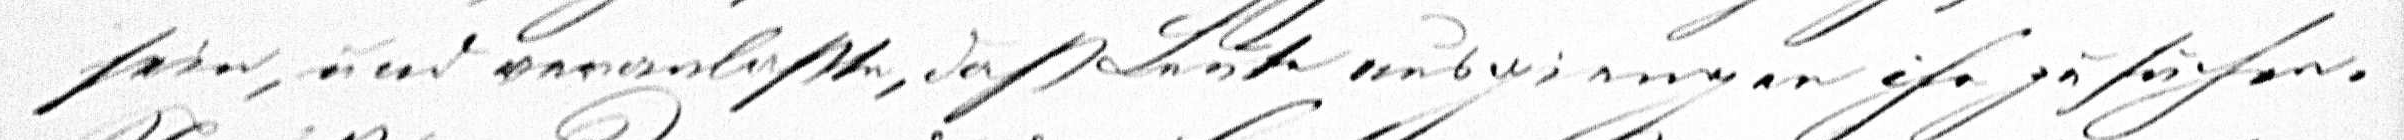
sein, und veranlaßte, daß Leute ausgiengen ihn zu suchen.
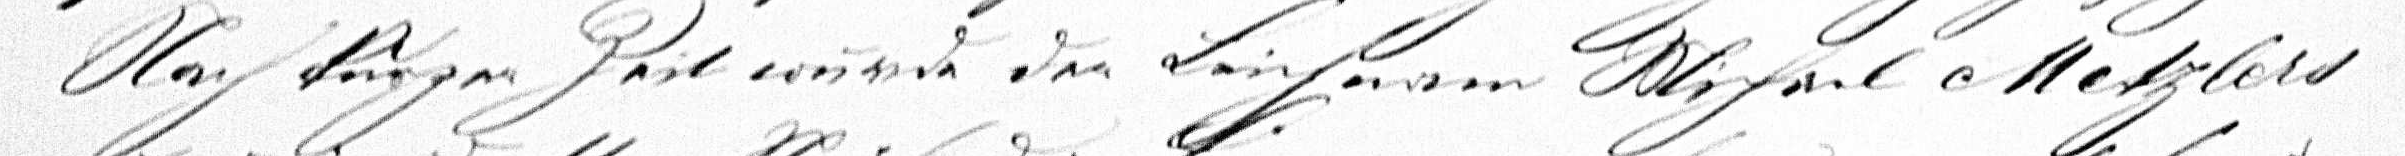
Nach kurzer Zeit wurde der Leichnam Michael Metzlers
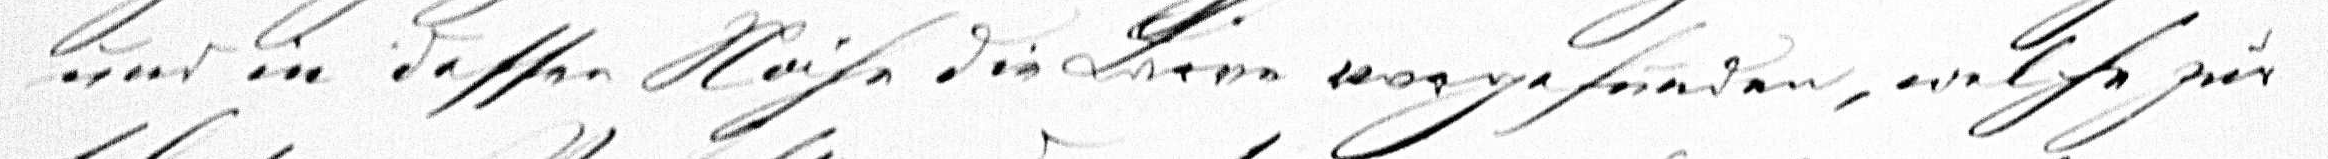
und in dessen Nähe die Larve vorgefunden, welche zur
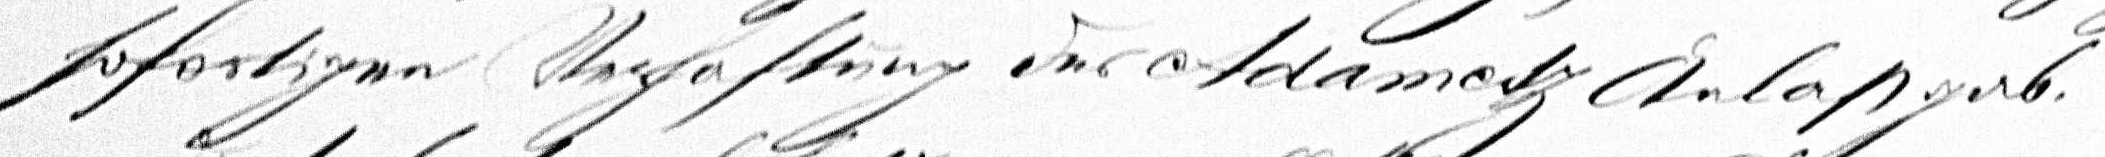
sofortigen Verhaftung des Adametz Anlaß gab.
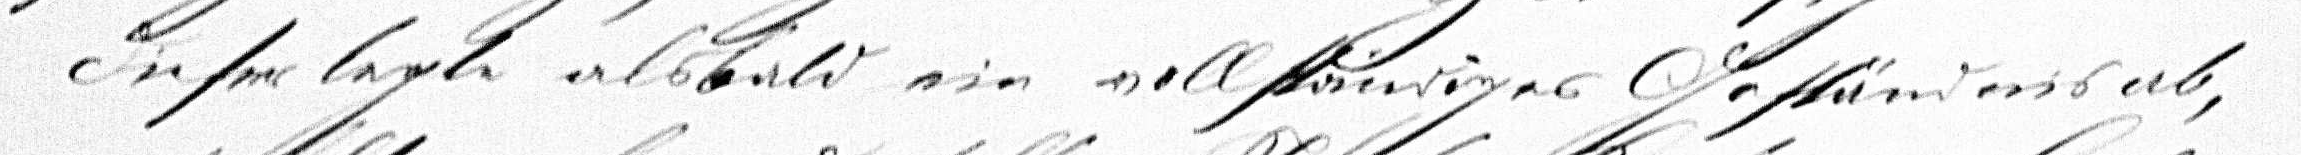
Dieser legte alsbald ein vollständiges Geständnis ab,
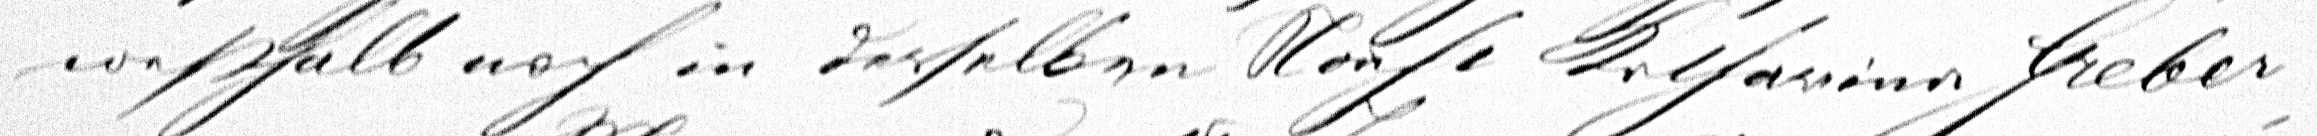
weßhalb noch in derselben Nacht Katharina Greber
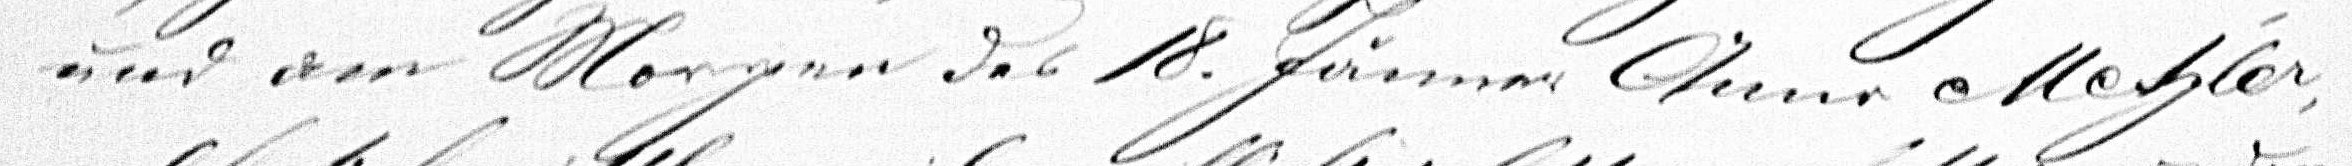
und am Morgen des 18. Jänner Anna Metzler, welche
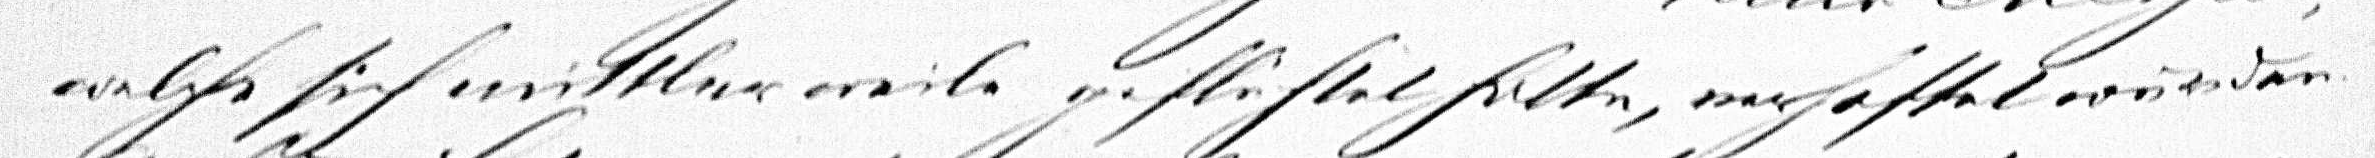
sich mittlerweile gefluchtet hatte, verhaftet wurden.
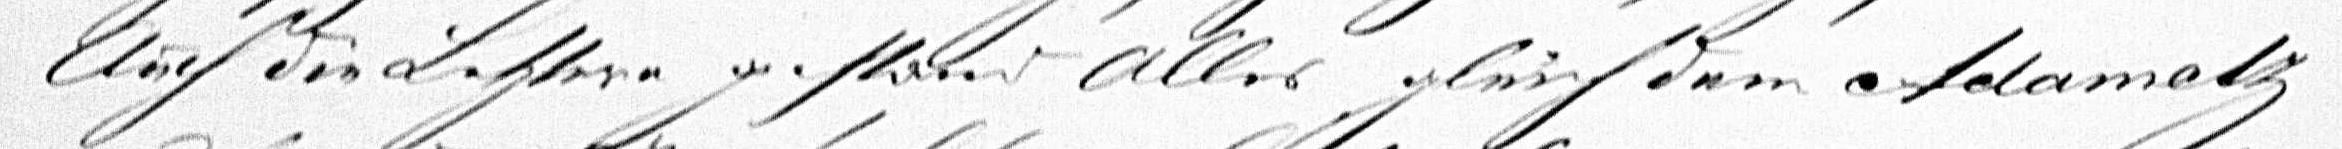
Auch die letztere gestand Alles gleich dem Adametz
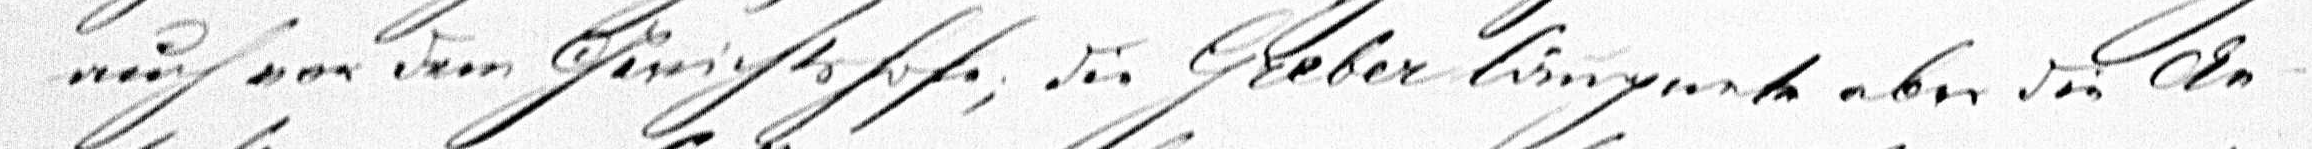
auch vor dem Gerichtshofe; die Greber läugnete aber die An¬
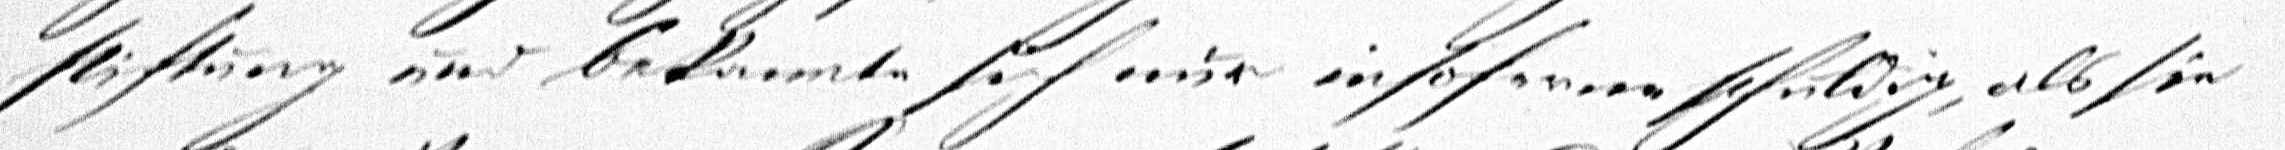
stiftung und bekannte sich nur insoferne schuldig, als sie
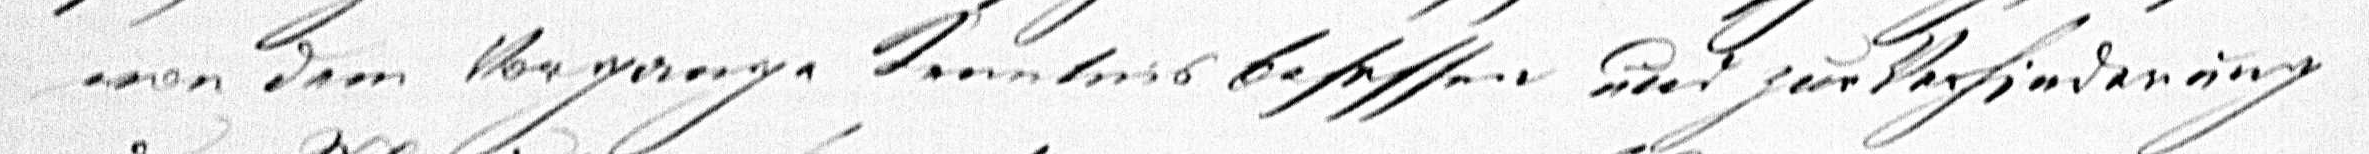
von dem Vorgange Kenntnis besessen und zur Verhinderung
